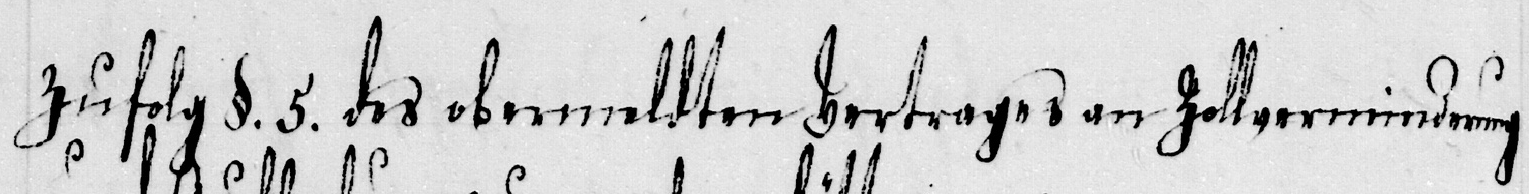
zufolg §.5. des obermeldten Vertrages an Zollverminder¬
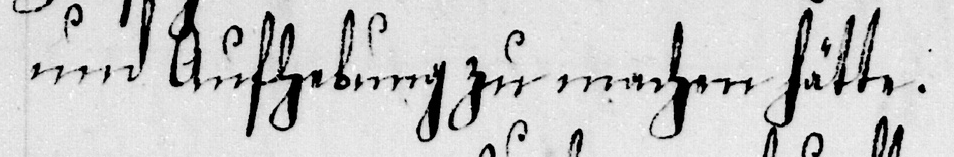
und Aufhebung zu machen hätte.
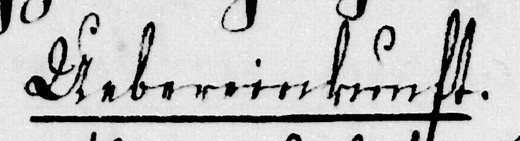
Uebereinkunft.
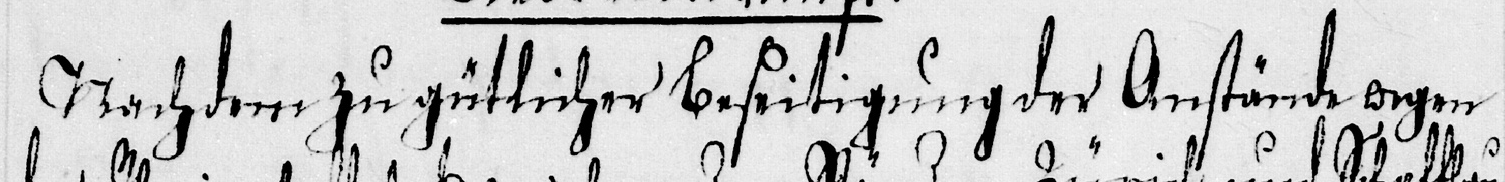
Nachdem zu gütlicher Beseitigung der Anstände wegen
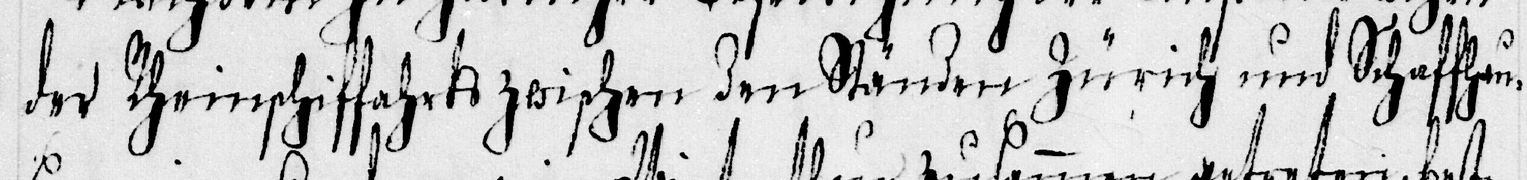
der Rheinschiffahrt zwischen den Ständen Zürich und Schaffha¬
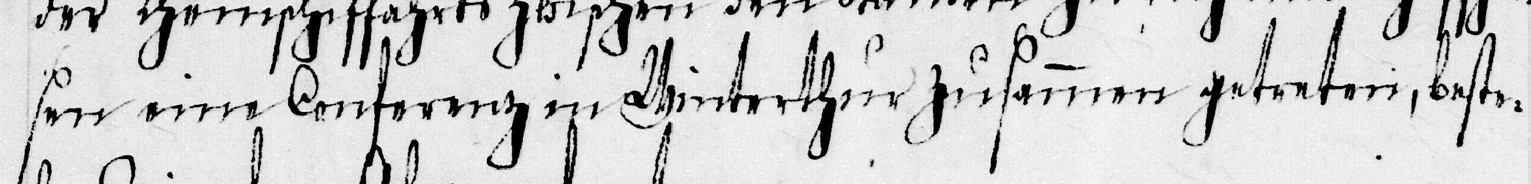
usen eine Conferenz in Winterthur zusammen getreten, beste¬
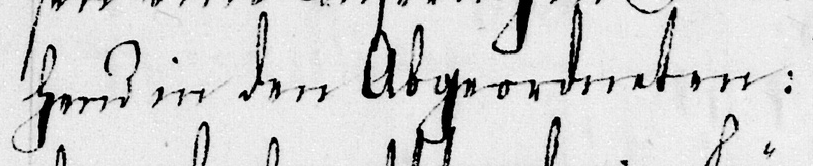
hend in den Abgeordneten:
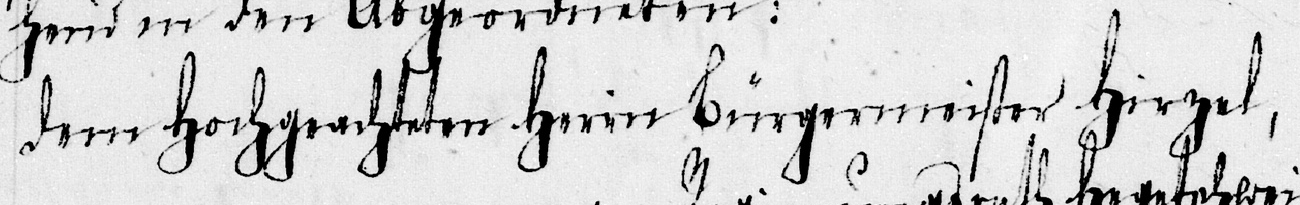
dem Hochgeachteten Herrn Bürgermeister Hirzel,
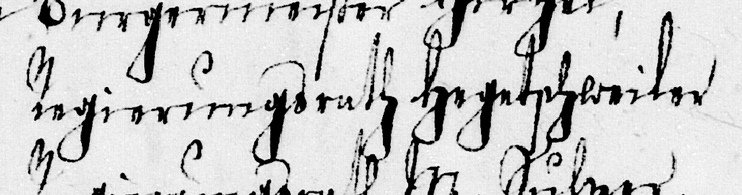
Regierungsrath Hegetschweiler
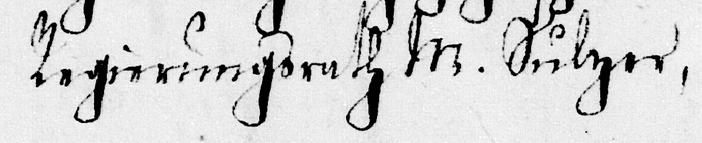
Regierungsrath M. Sulzer,
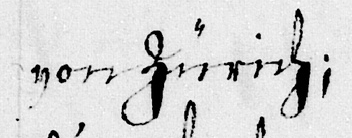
von Zürich;
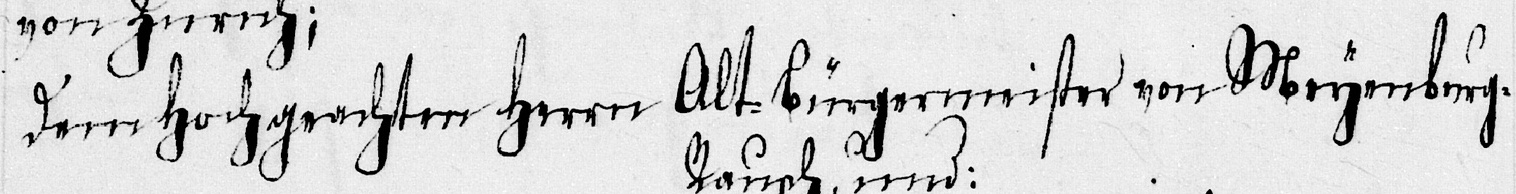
Dem Hochgeachteten Herrn Alt-Bürgermeister von Meyenbur¬
